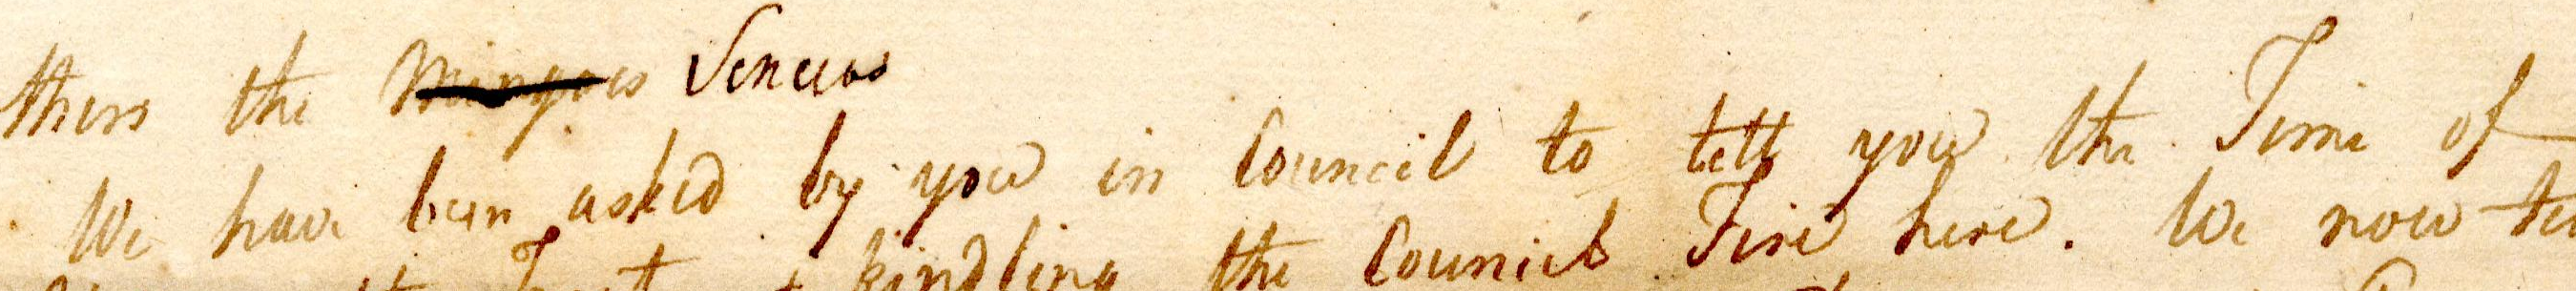We have ben asked by you in Council to tell you the Time of
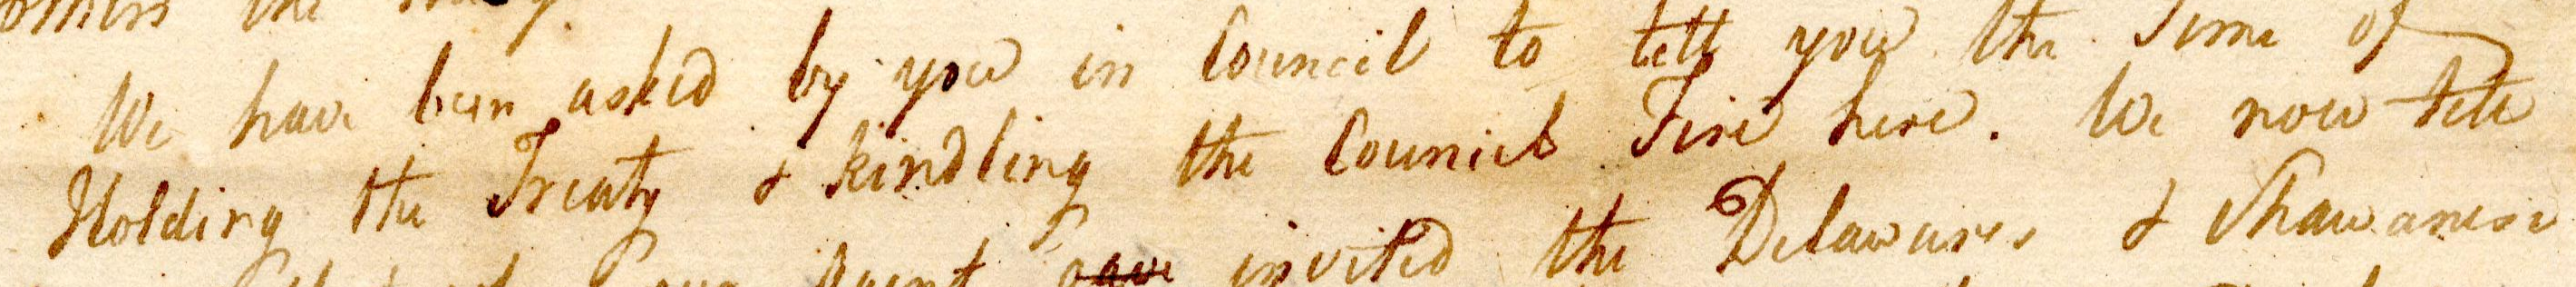Holding the Treaty & kindling the Council Fire here. We now tell
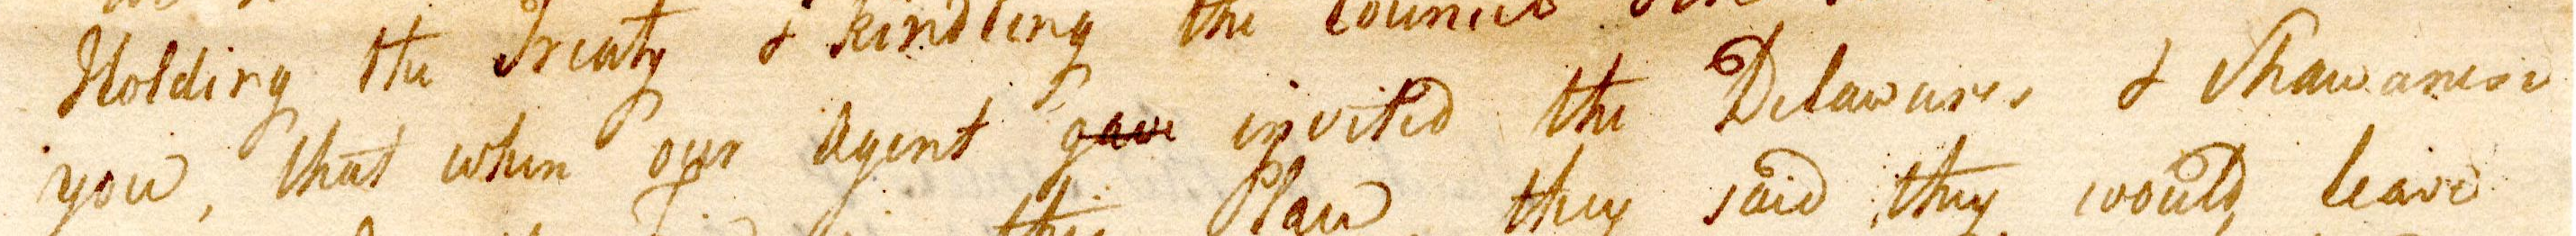you that when our agent gave invited the Delawares & Shawanese
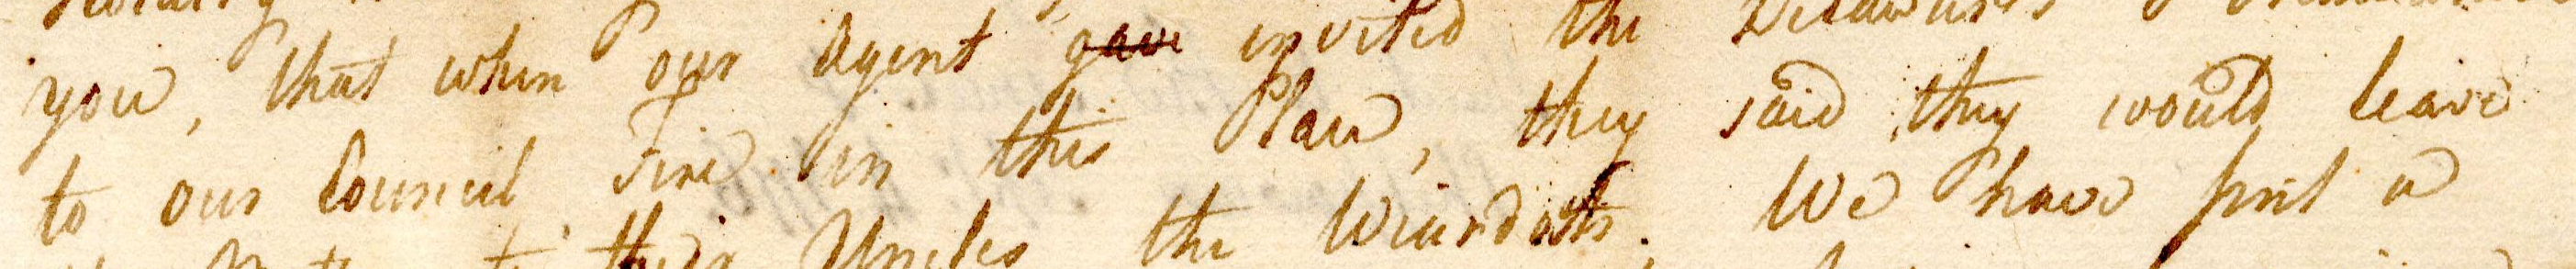to our Council Fire in the Place, they said they would leave
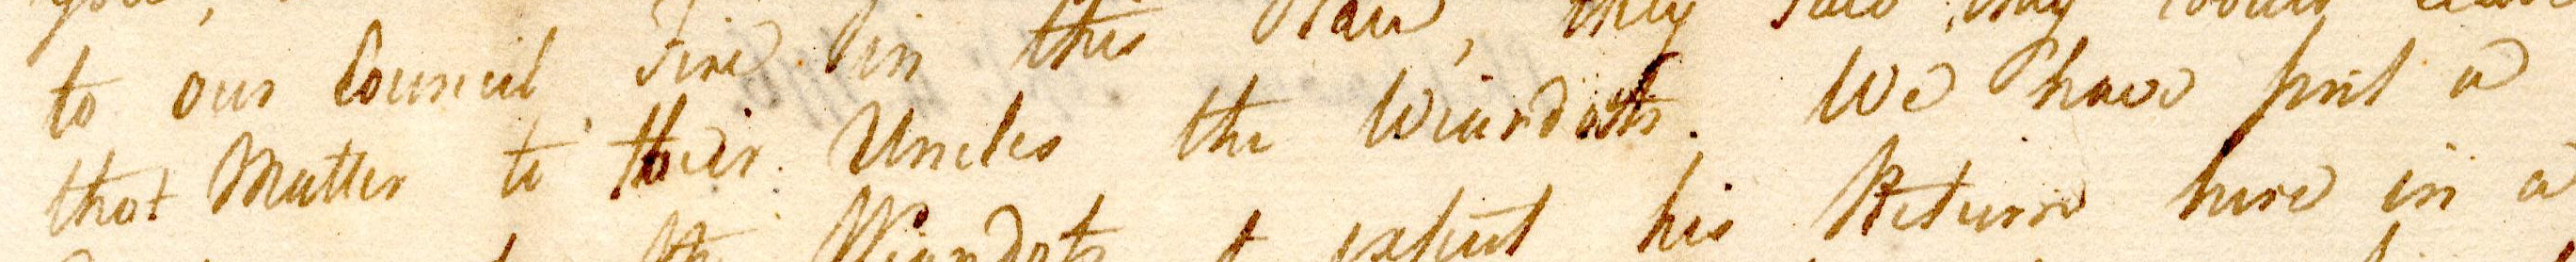that Matter to their Uncles the Wiandots. We have put a
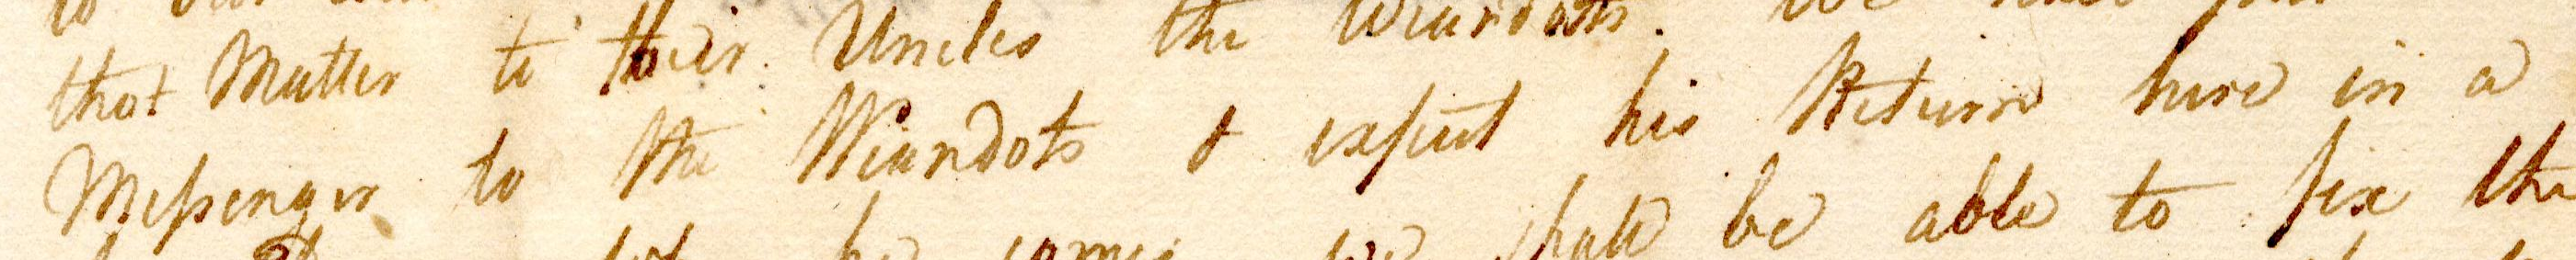Messenger to the Wiandots & expect his Return here in a
